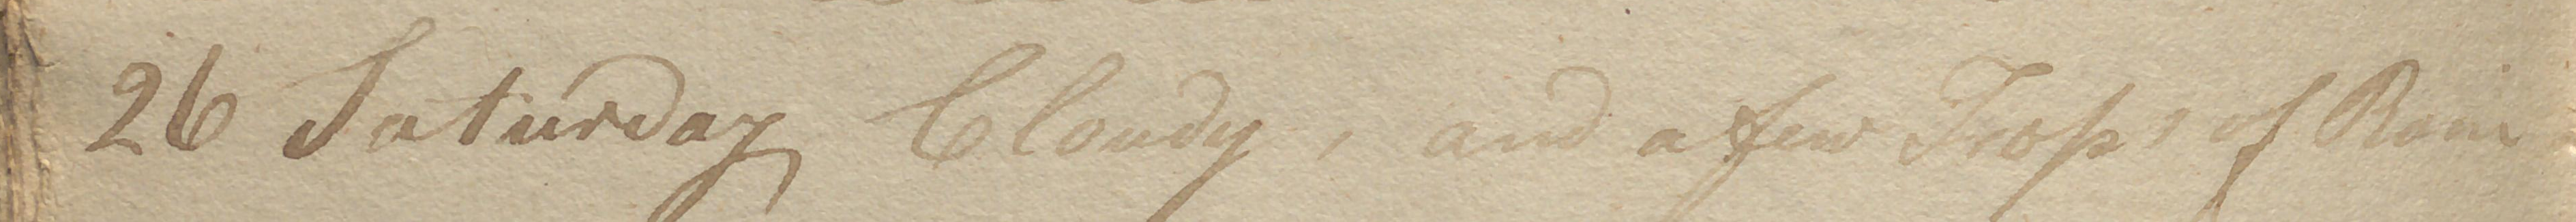26 Saturday Cloudy, and a few Trops of Rare
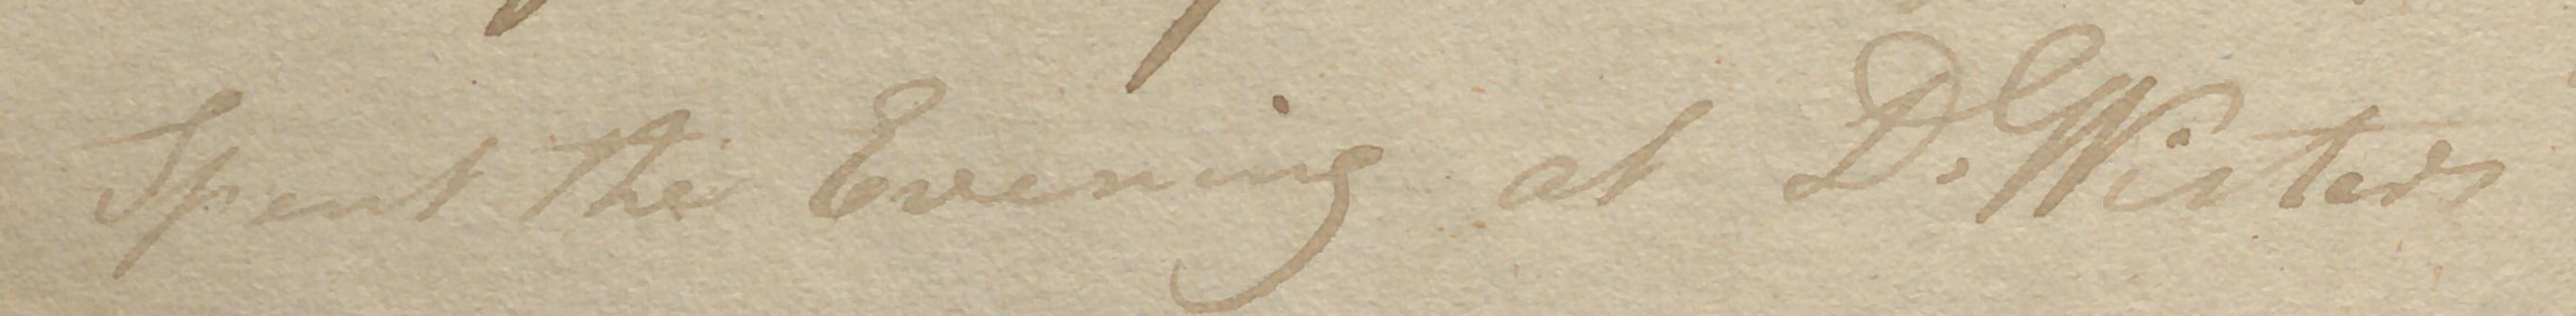spent the Evening at D^l. Wisters
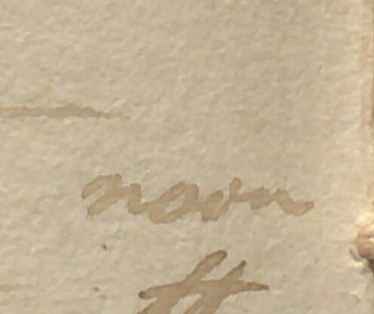noon
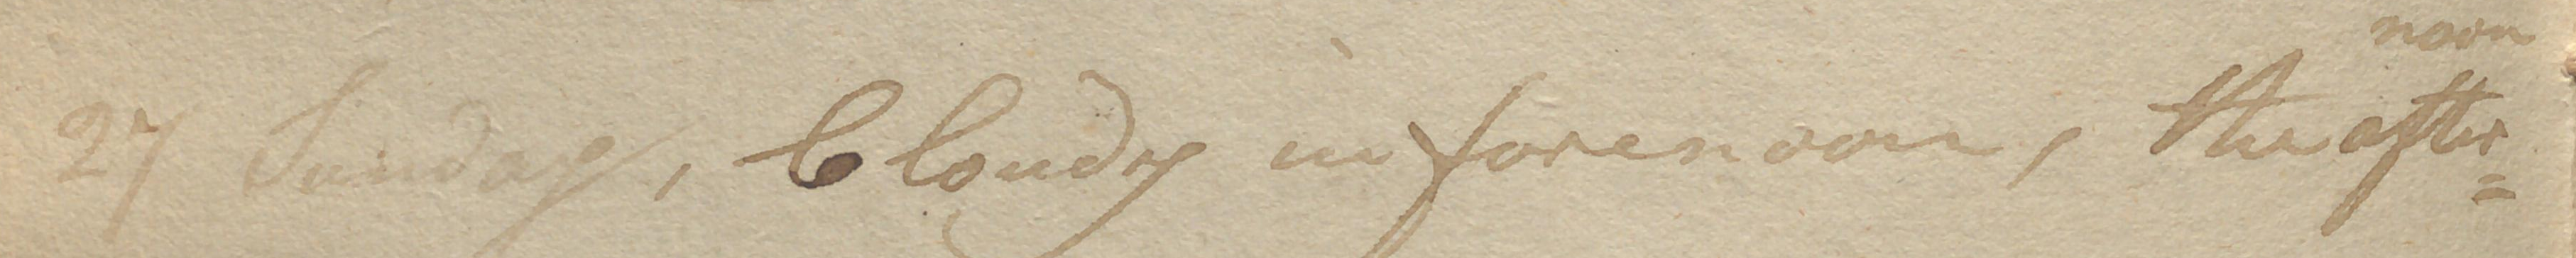27 Sunday, Cloudy in forenoon, the after-
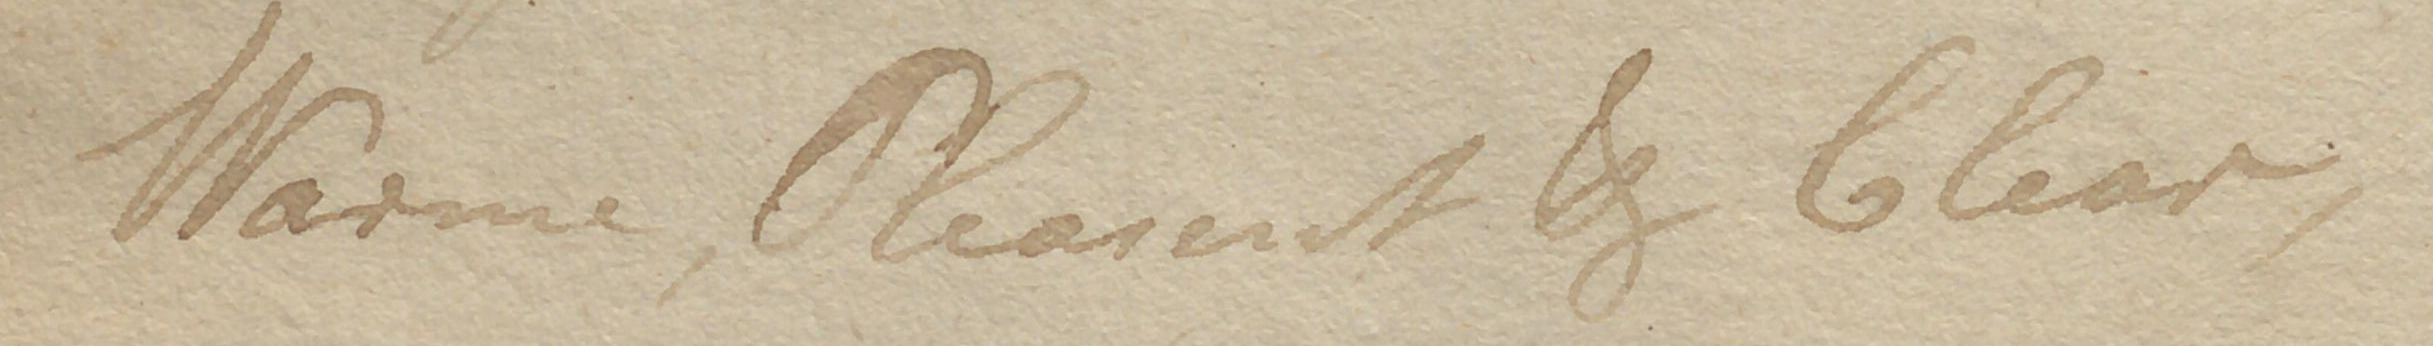Warme, Pleasent & Clear,
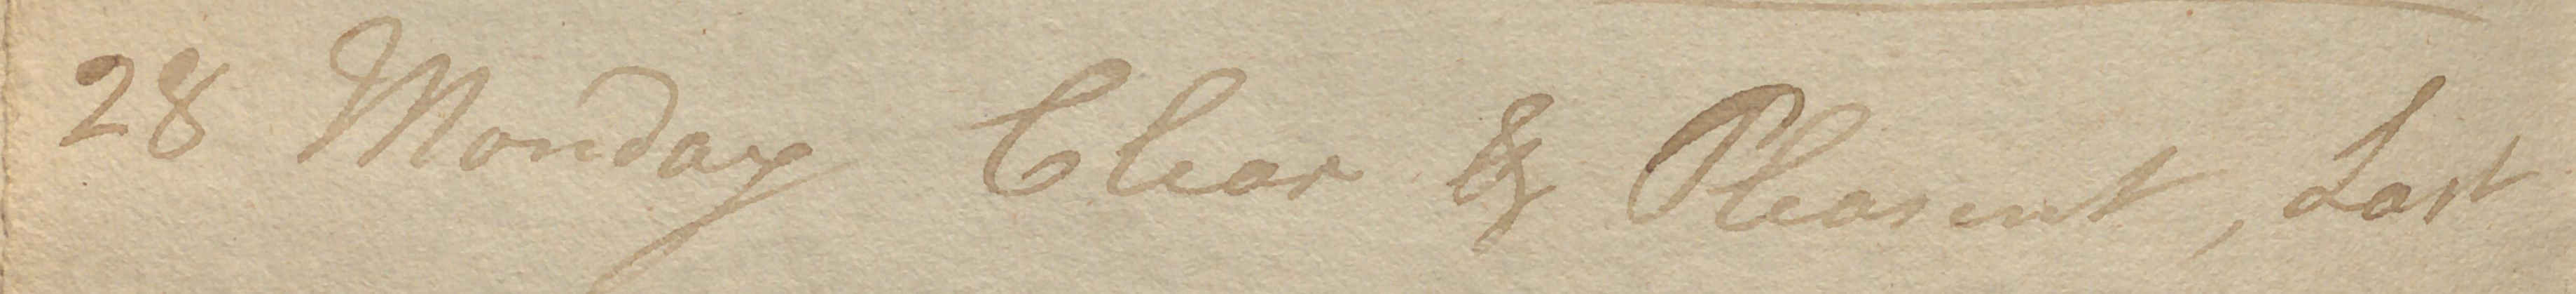28 Monday Clear & Pleasent Last
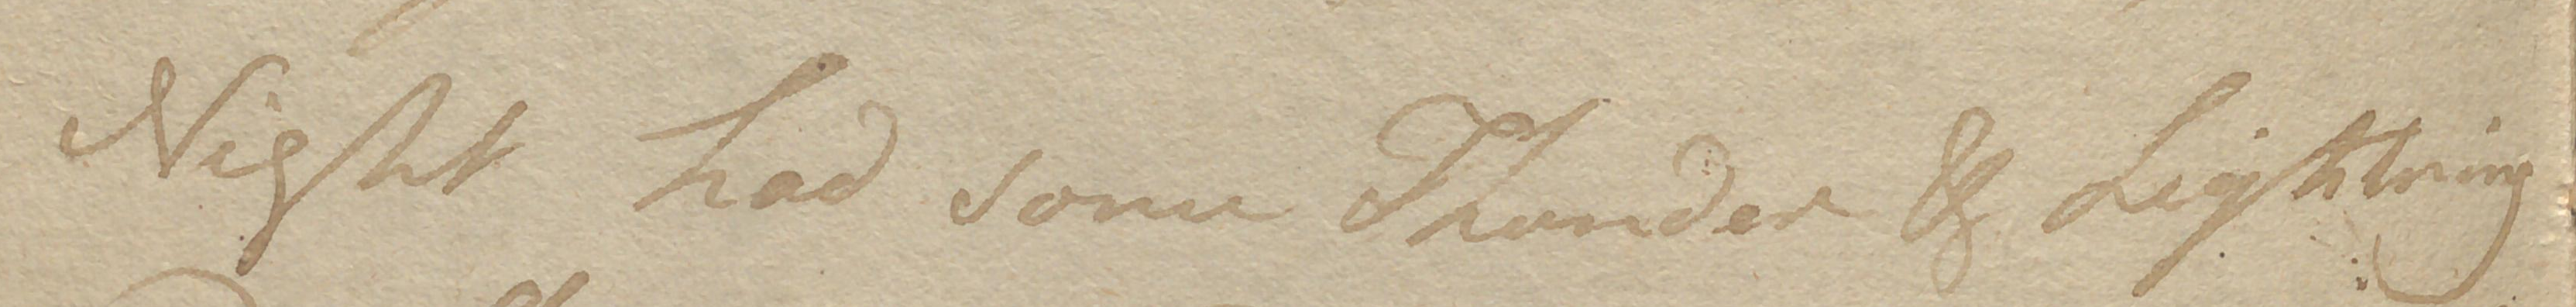Night had some Thunder & Lightning
